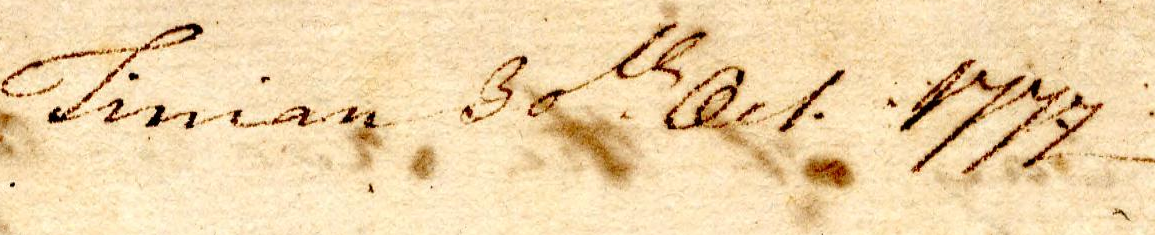Tinian 30^th Oct. 1777
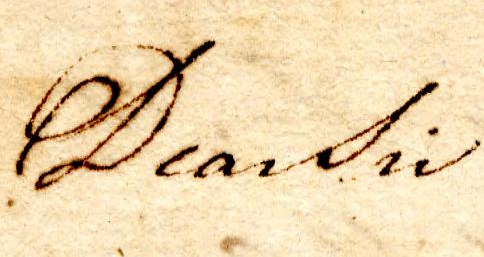Dear Sir
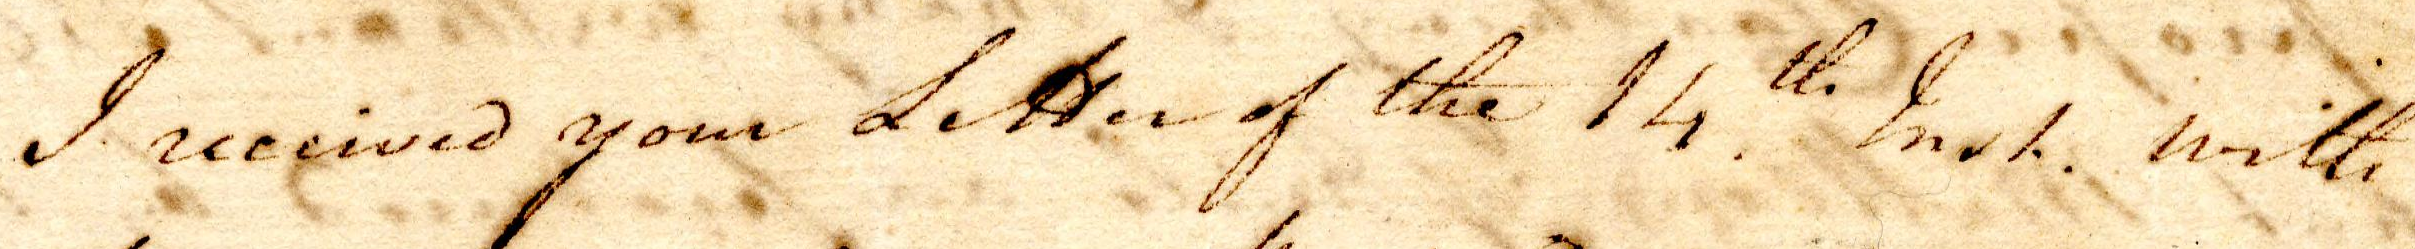I received your Letter of the 14^th Inst. with
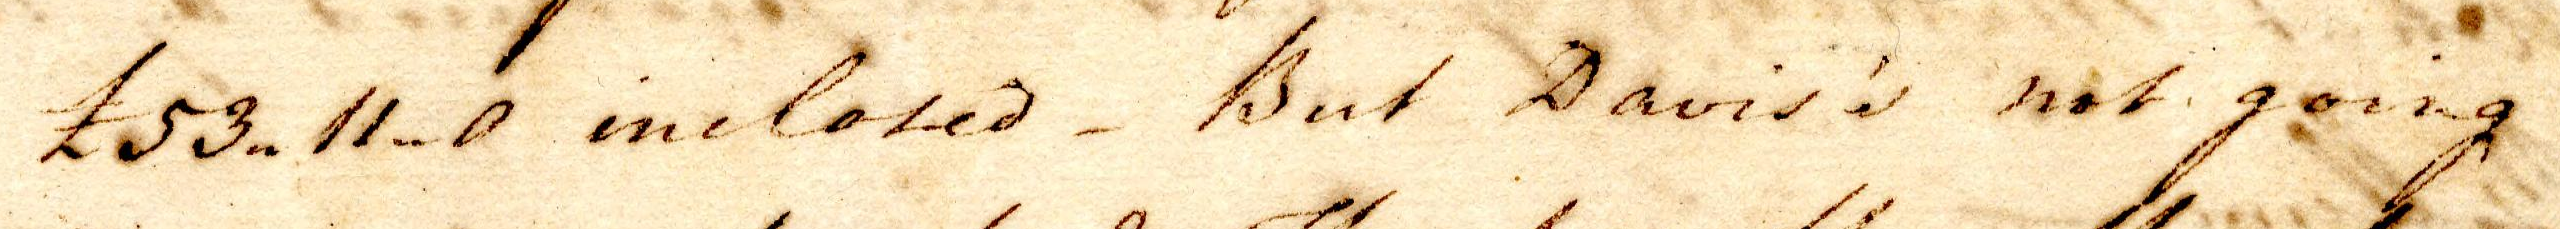£53.11.0 inclosed- But Davis's not going
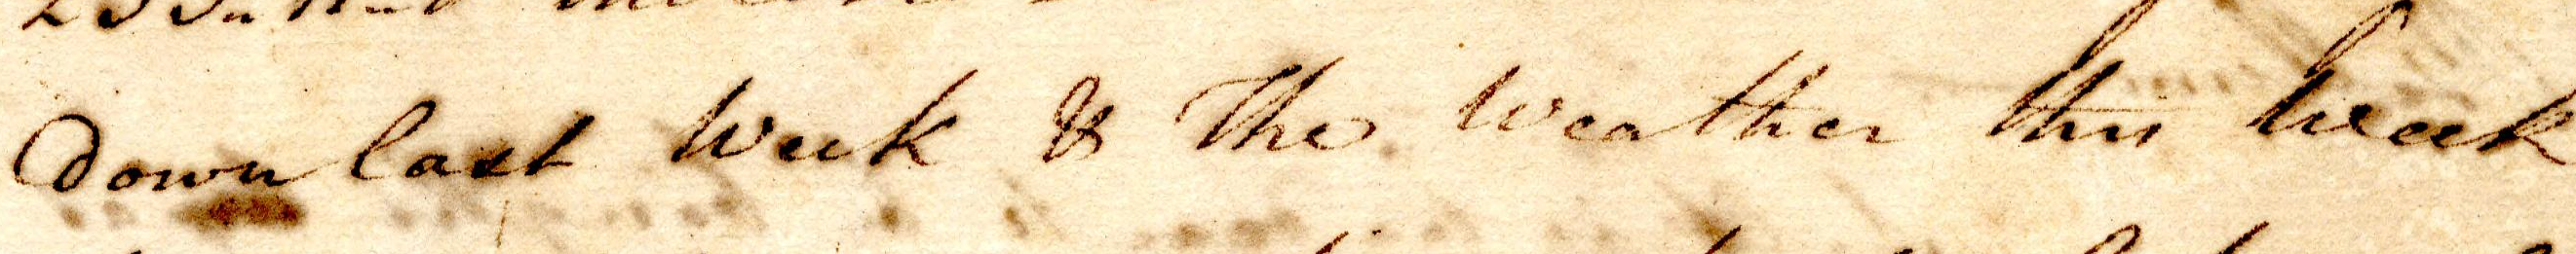down last week & the weather this week
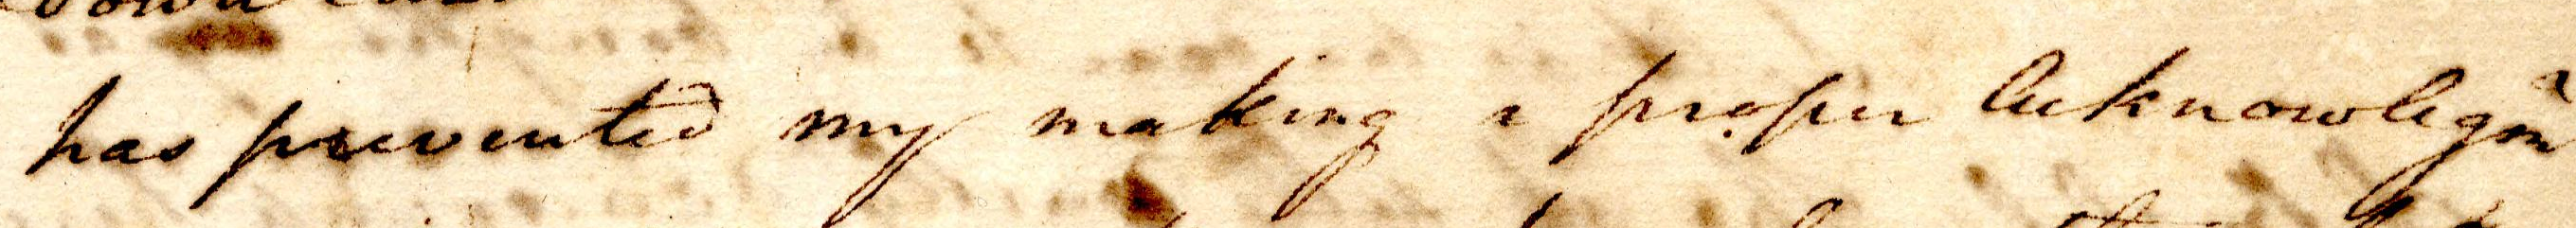has prevented my making a proper Acknowlegm
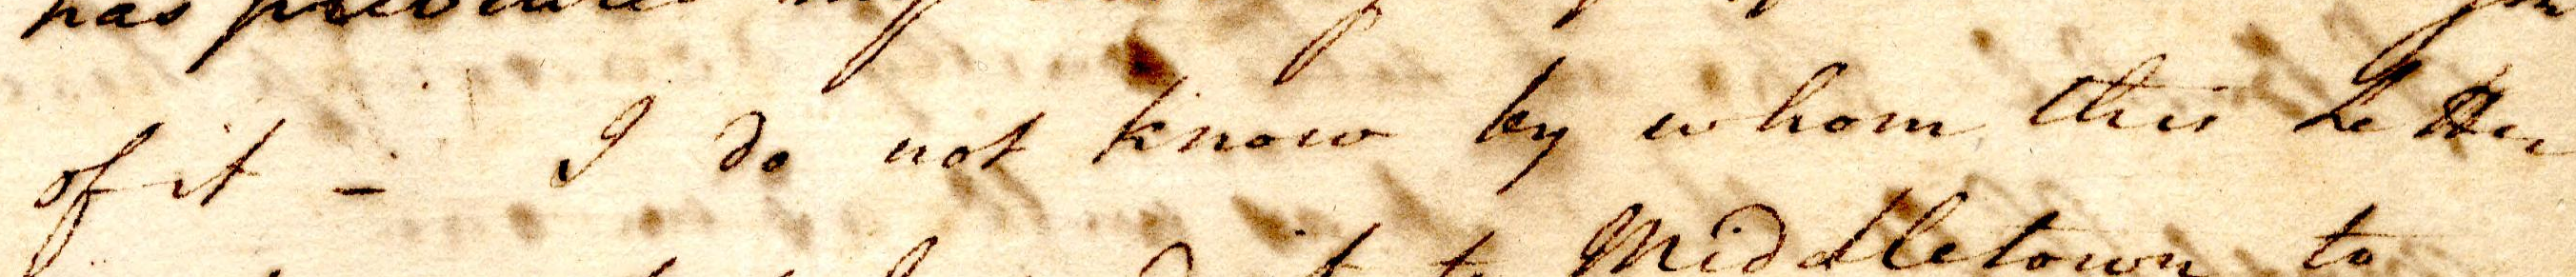of it. I do not know by whom this Letter
